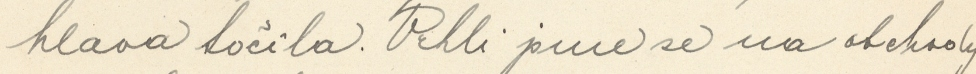hlava točila. Vrhli jsme se na obchody
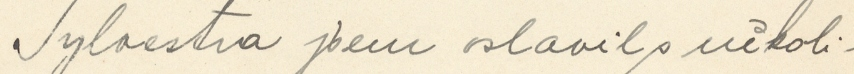Sylvestra jsem oslavil s několi-
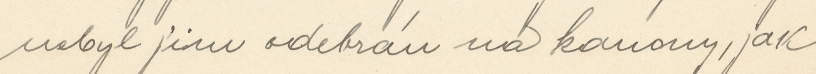nebyl jim odebrán na kanony, jak
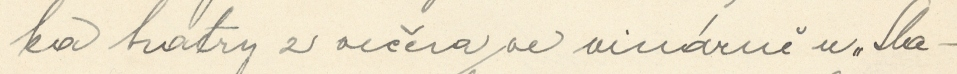ka bratry z večera ve vinárně u „Sla-
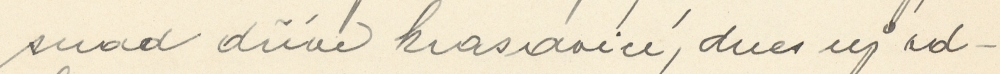snad dříve krasavicí, dnes už od-
